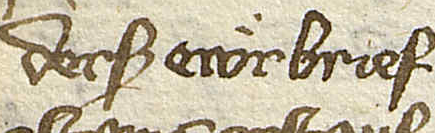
Derſ* eẅr brief
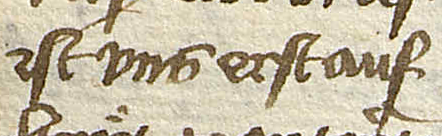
iſt vns erſt auf
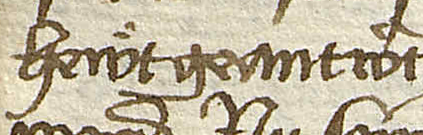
heẅt geantw*t
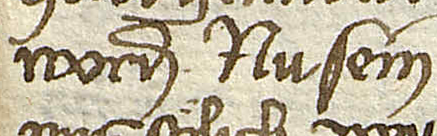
word* . Nu ſein
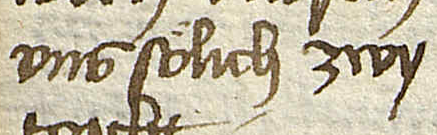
vns ſölich ʒwy =
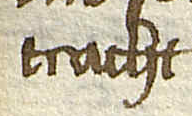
tracht
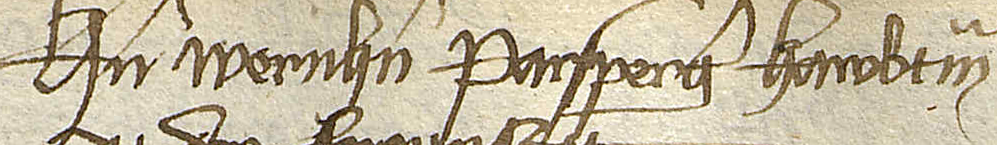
Hn* wernhn* Parſperg* Hawbtm*
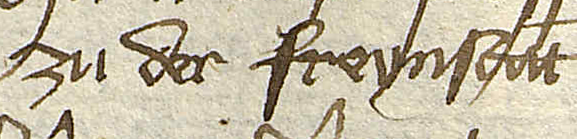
ʒu der freynſtat
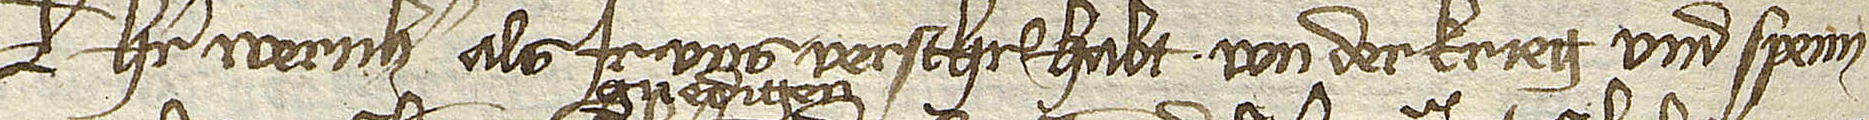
L* hr* wernh* als Ir vns verſchr* habt . von der krieg vnd ſpenn
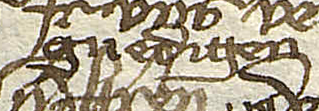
gnedigen
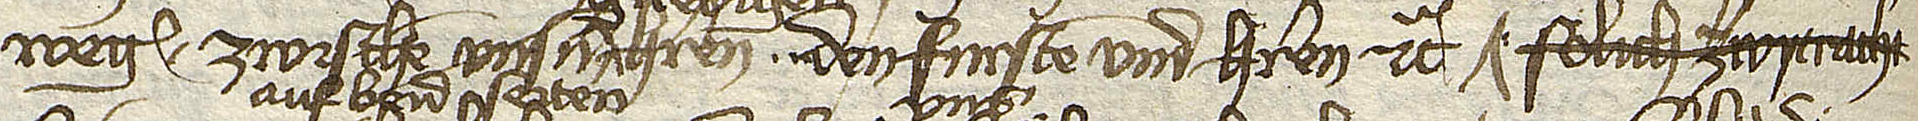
weg* / ʒwiſche* vnſn* h*ren ~ den furſte* vnd h*ren ec* ſölich ʒwytracht
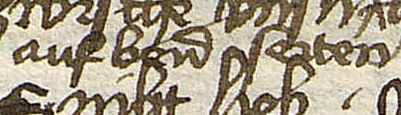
auf beid ſeiten
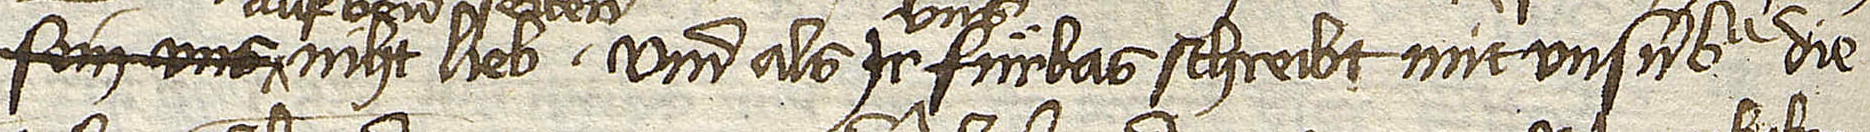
ſein vns niht lieb / vnd als Ir fürbas ſchreibt mit vnſn* b* die
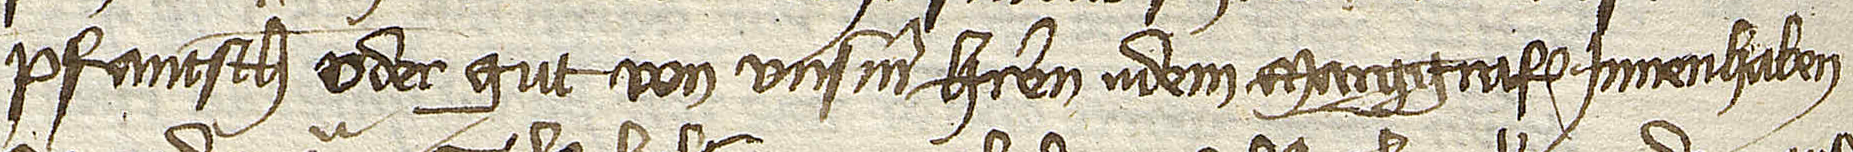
pfantſch* oder gut von vnſm* h*ren ~ dem Marggraf* Innenhaben
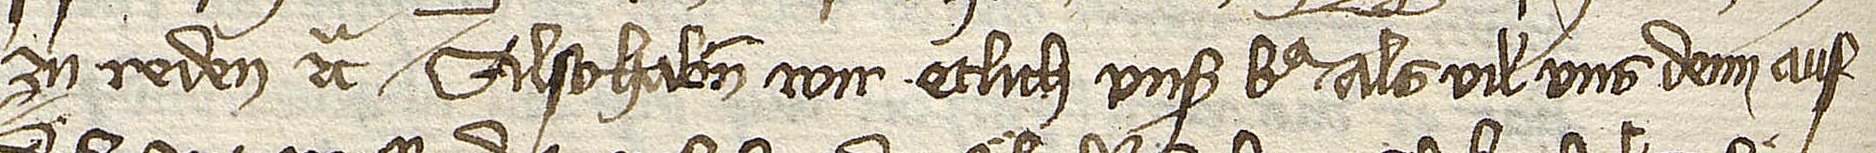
ʒu reden ec* / Alſo habn* wir etlich vnſ* b* / als vil vns denn auf
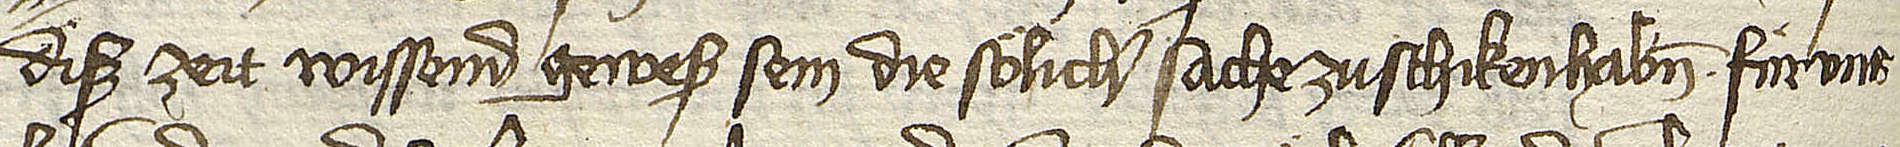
diſʒ ʒeit wiſſend geweſ* ſein die ſölich* ſache ʒu ſchiken habn* . für vns
